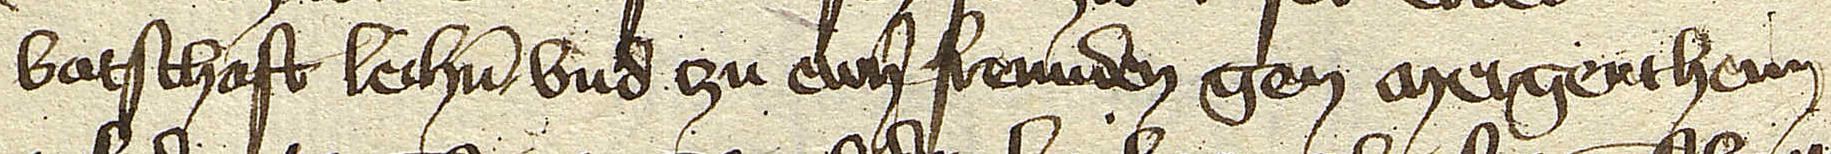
botſchaft leihn* vnd cʒu ewn* freunden gen Mergentheim
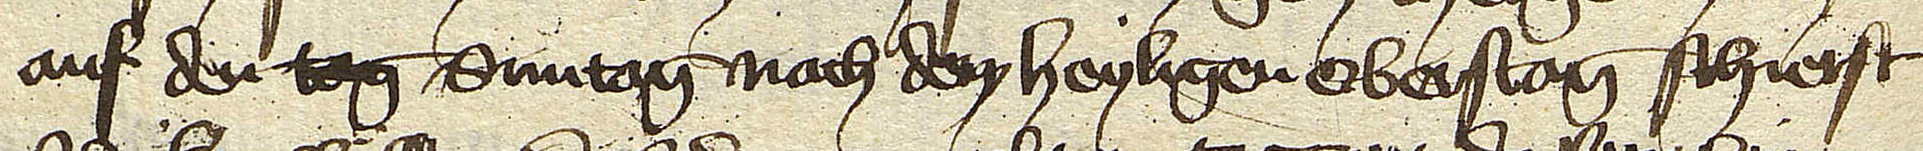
auf den tag / Suntag nach dem heyligen Oberſtag ſchierſt
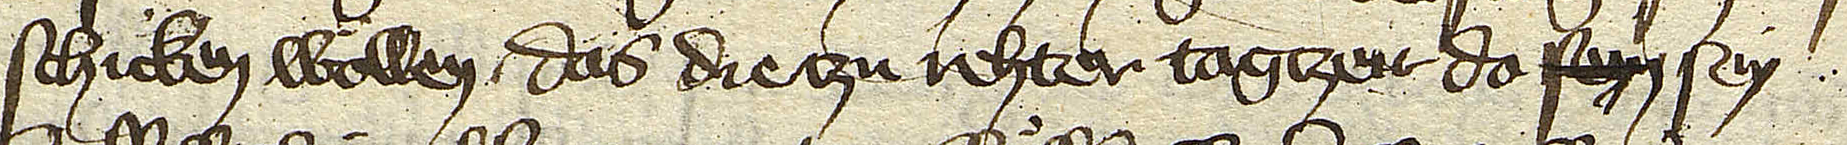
ſchicken wöllen / das die cʒu rehter tagcʒeit do ſein ſey
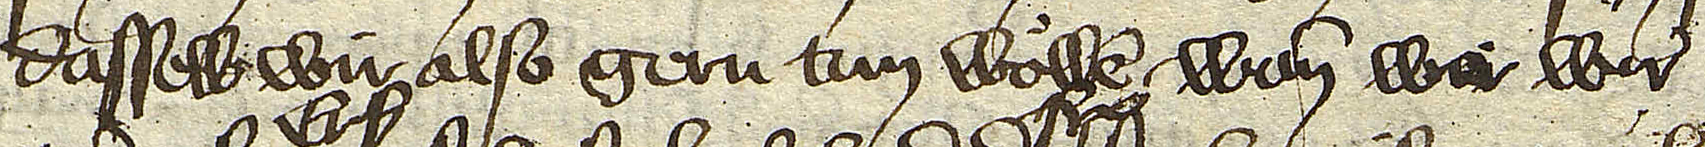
daſſelb wir alſo gern tun wölle* / wan* wor wir
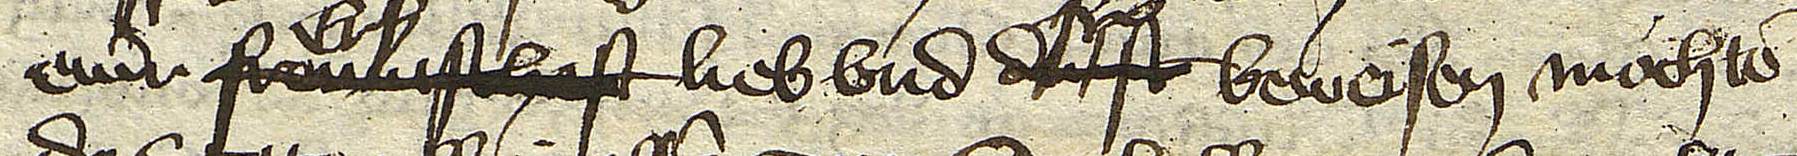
ew*r freuntſchaft lieb vnd dinſt beweiſen möchte*
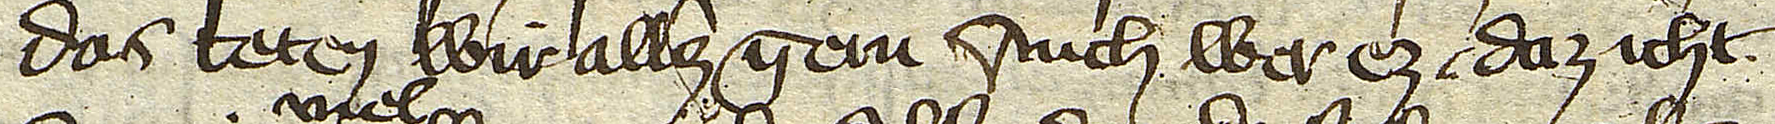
das teten wir allcʒ* gern Auch wer eʒ / daʒ icht
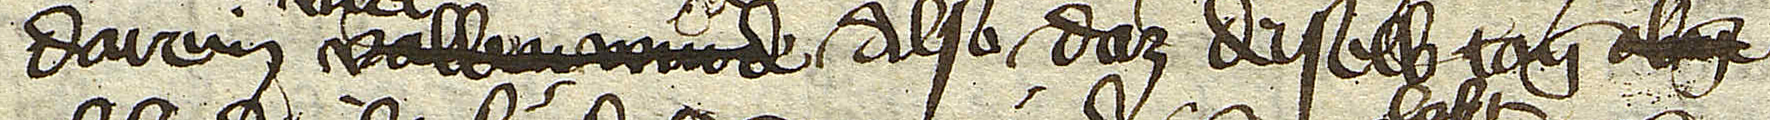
darein vallen würde / Alſo / daʒ derſelb tag abge*
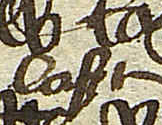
laſʒt
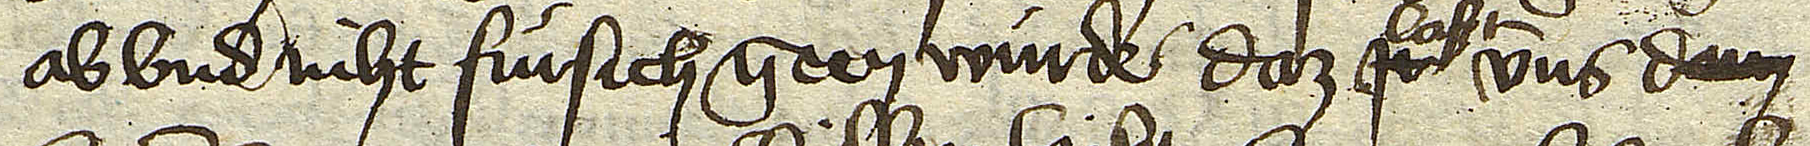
ab vnd niht fürſich geen würde / daʒ Ir vns dan
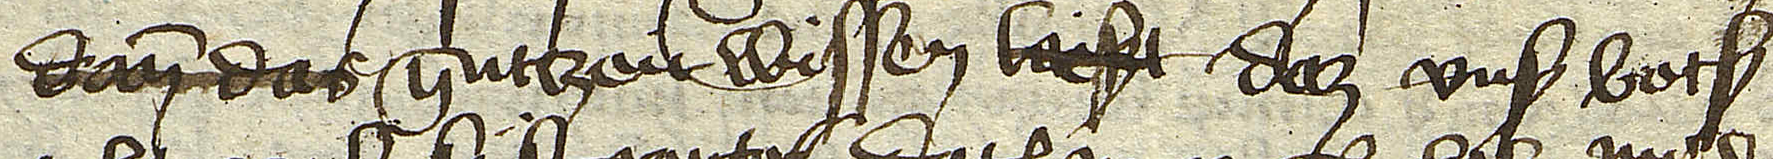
dan* das gutcʒeit wiſſen lieſʒt / daʒ vnſ* botſ*
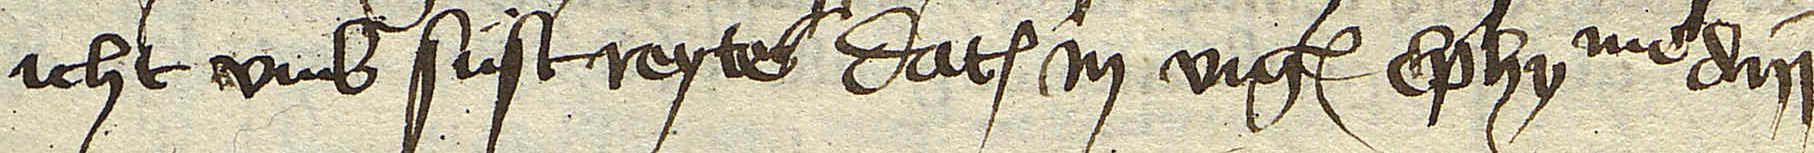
icht vmb ſüſt reyte / Dat* in vigi* Ephy* dni*
